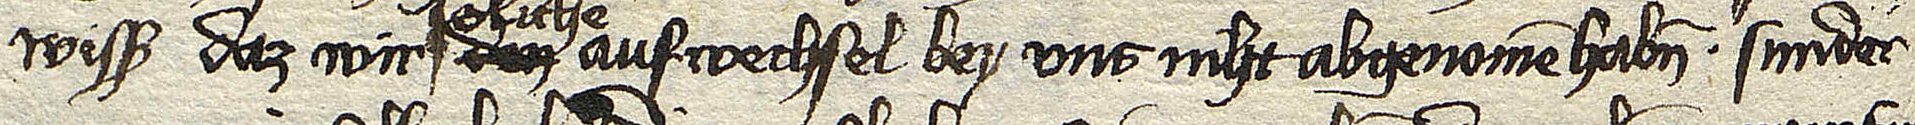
wiſſ* daʒ wir den aufwechsel bey vns niht abgenome* habn* . ſunder
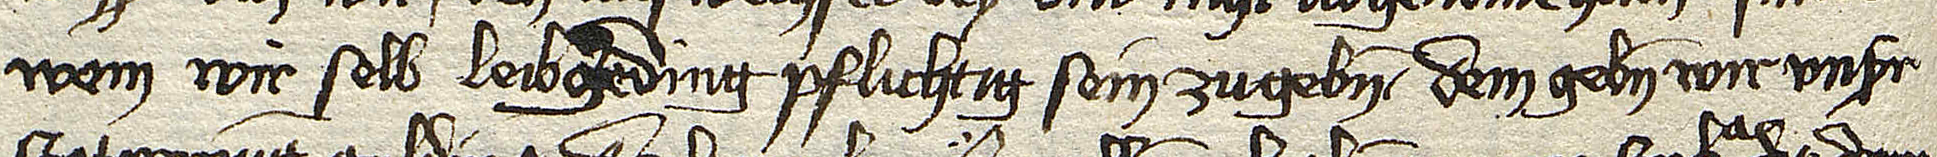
wem wir ſelb leibgeding pflichtig ſein ʒugebn* / Dem gebn* wir vnſ*r
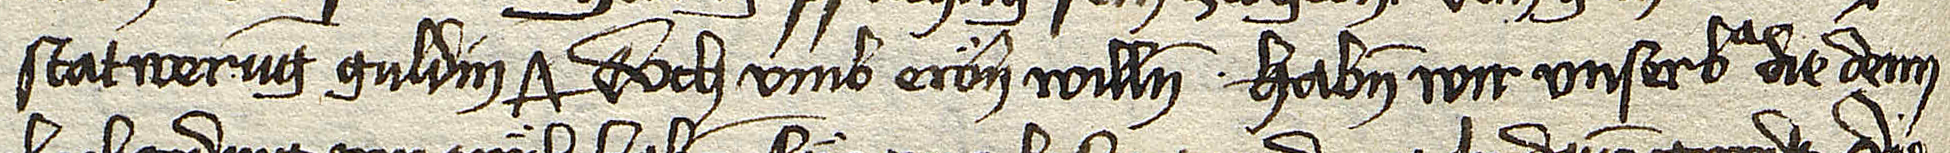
ſtatweru*g guldin Doch vmb eẅ*n willn* . habn* wir vnſer b* die denn
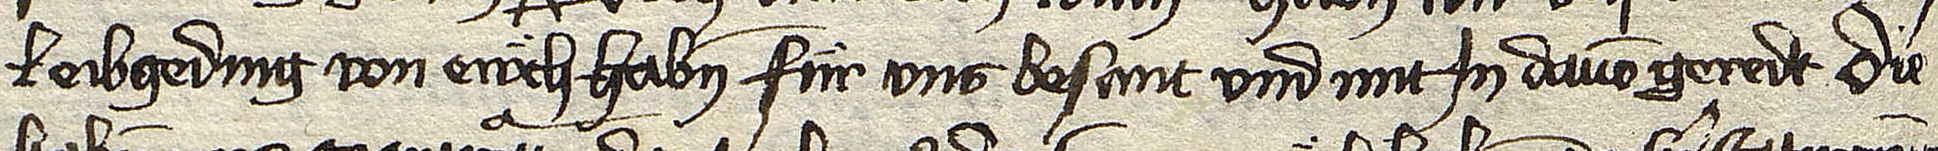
leibgeding von eẅch habn* für vns beſant vnd mit In dauo* geredt Die
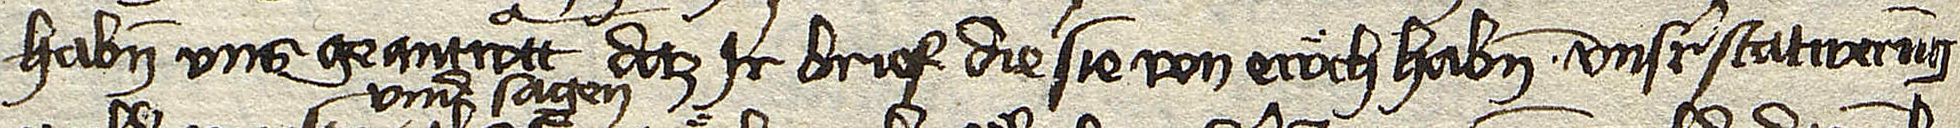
habn* vns geantw*tt daʒ Ir brief die ſie von eẅch habn* . vnſr* ſtatweru*g
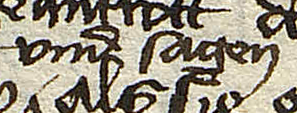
vnd ſagen
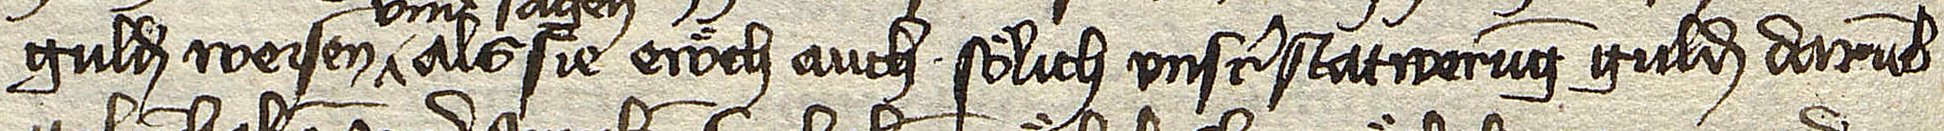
guld* weiſen / als ſie eẅch auch . ſölich vnſr* ſtatweru*g guld* darub*
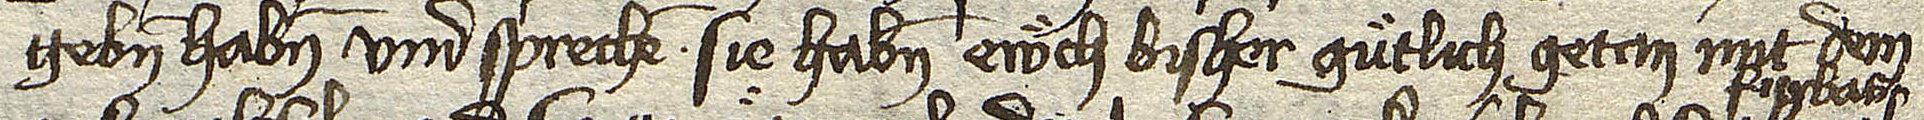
gebn* habn* vnd ſpreche* . ſie habn* eẅch biſher gütlich getan mit dem
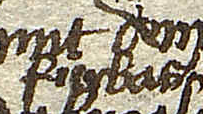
fürbas
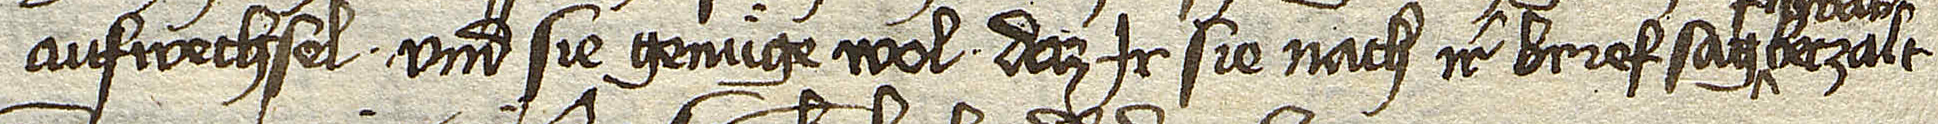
aufwechſel vnd ſie genüge wol daʒ Ir ſie nach ir* brief ſag becʒalt
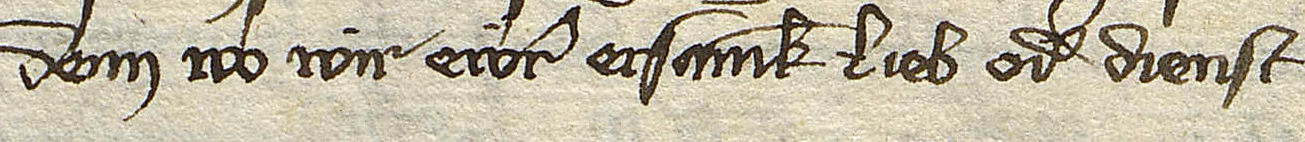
Denn wo wir eẅr* erſamk* lieb od* dienſt
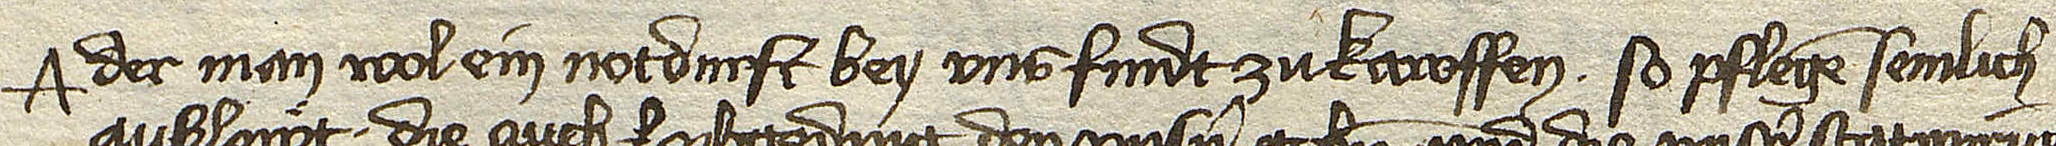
der man wol ein notdurft bey vns findt ʒu kawffen . ſo pflege* ſemlich
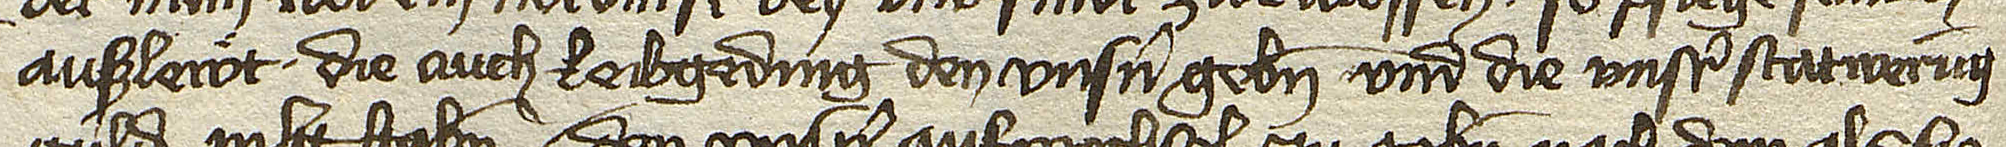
auſʒleẅt / die auch leibgeding den vnſn* gebn* vnd die vnſr* ſtatweru*g
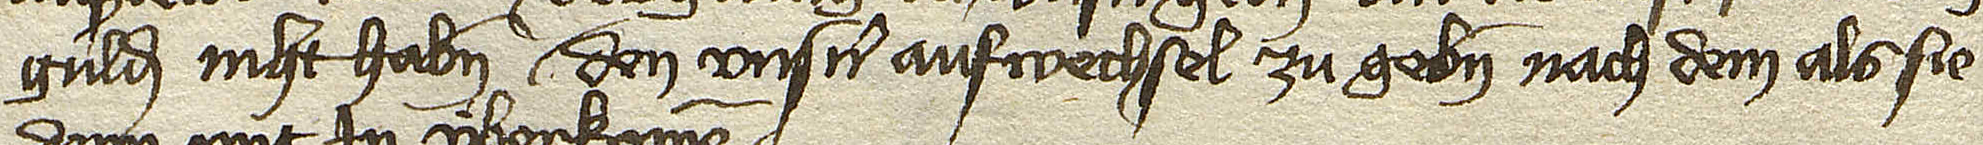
guld* niht habn* / den vnſn* aufwechſel ʒu gebn* nach dem als ſie
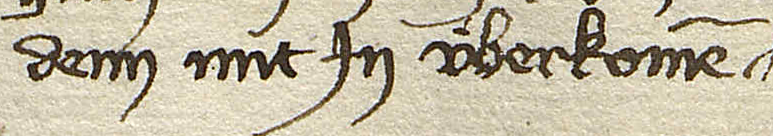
denn mit In berkome* /
